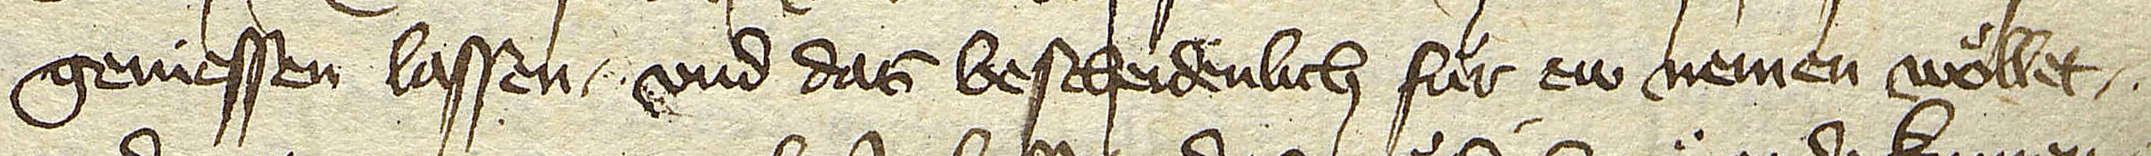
genieſſen laſſen / vnd das beſcheidenlich für ew nemen wöllet / .
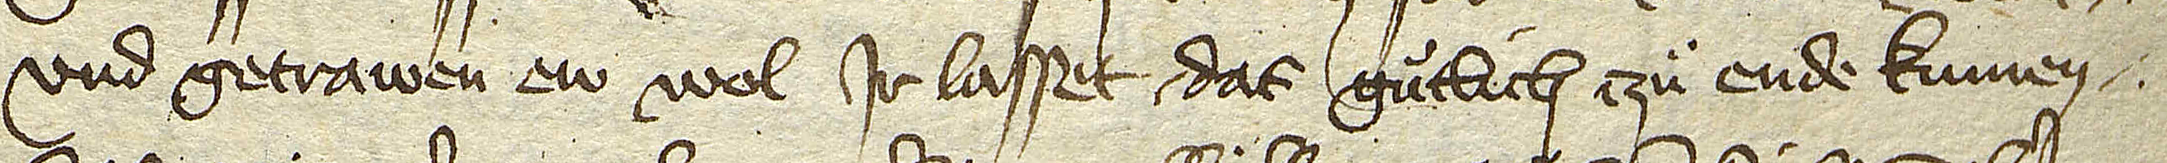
vnd getrawen ew wol Ir laſſet / das gütlich cʒü ende kumen / .
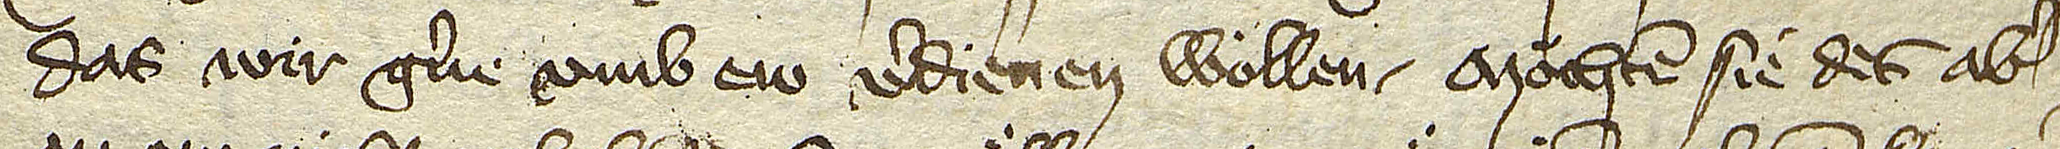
das wir g*ne vmb ew v*dienen wöllen / Möchte* ſie des ab*
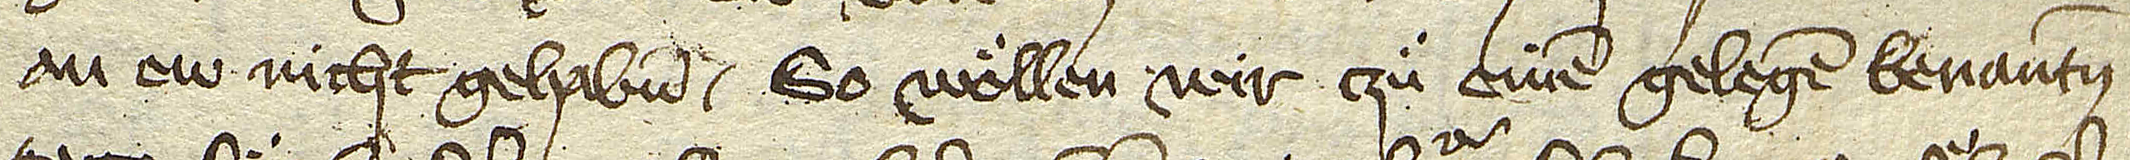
an ew nicht gehabn* / So wöllen wir cʒü eine* gelege* benantn*
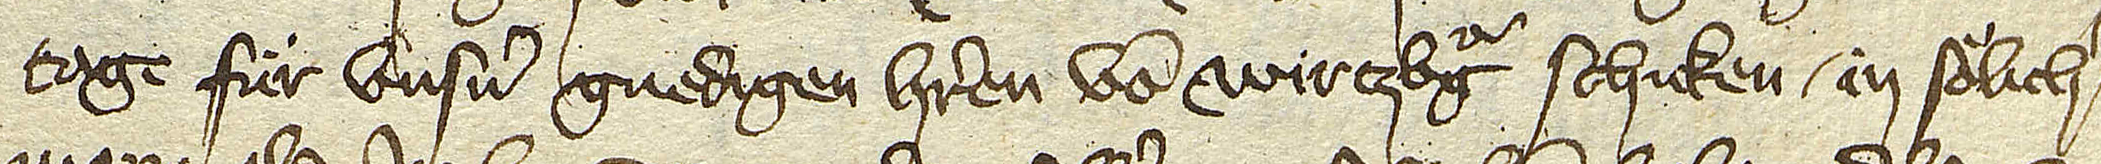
tage für vnſn* gnedigen hr*en vo* wircʒb*g ſchicken / in ſölich*
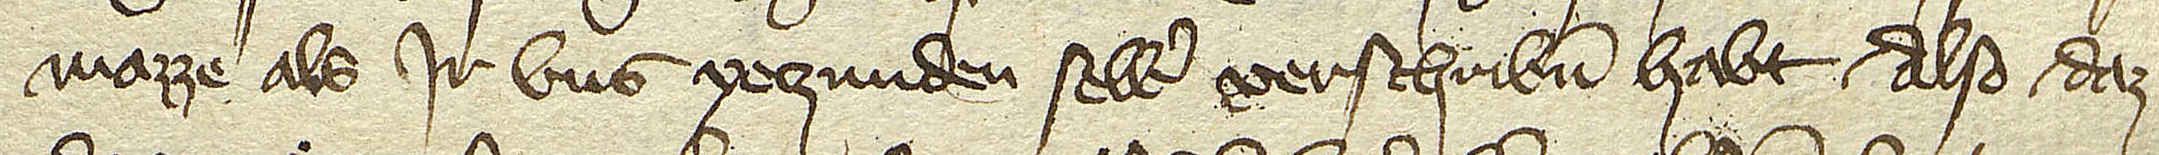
maʒʒe als Ir vns yecʒunden ſelb* verſchribn* habt / Alſo / daʒ
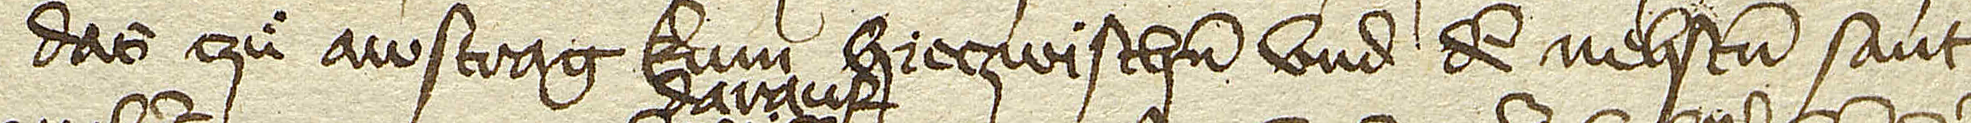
das cʒü awſtrag kum hiecʒwiſchn* vnd d* nehſtn* ſant
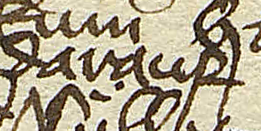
darauf
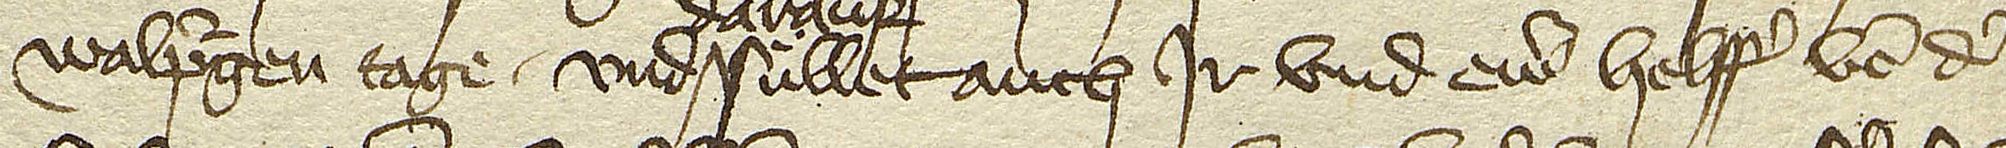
walp*gen tage / vnd ſüllet auch Ir vnd ew* helff* vo* d*
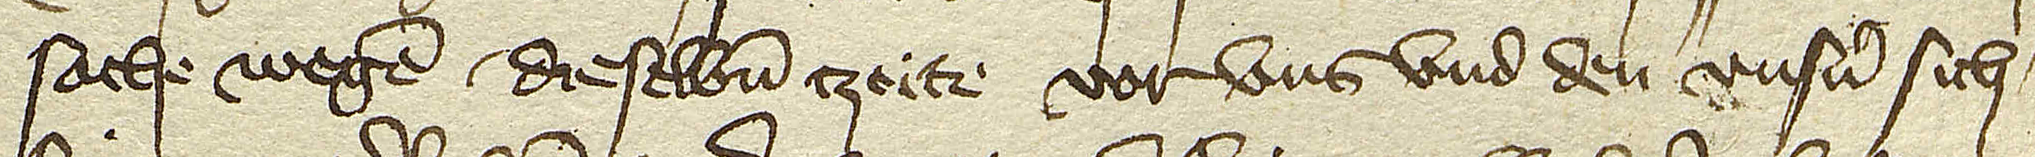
ſache wege* / dieſelbn* cʒeite vor vns vnd den vnſn* ſich*
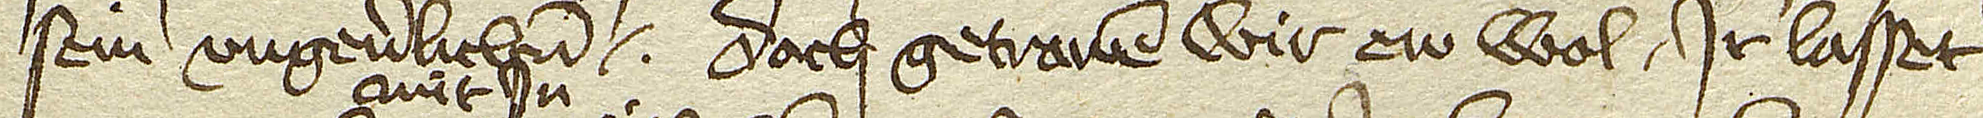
ſein vngeu*lichn* / . Doch getrawe* wir ew wol / Ir laſſet
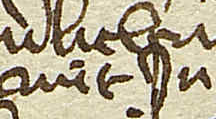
mit In
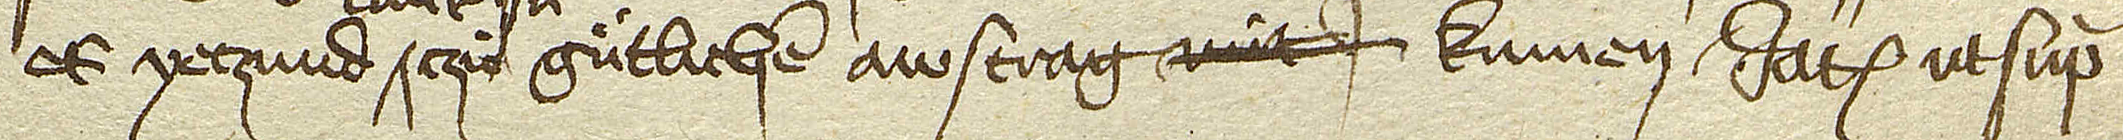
es yecʒund cʒü gütliche* awſtrag mit I kumen / Dat* ut ſup*
